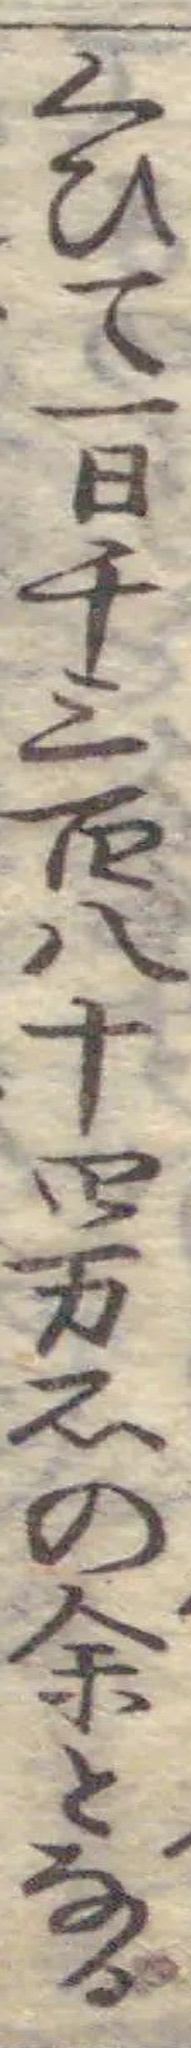くひて一日千三百八十四万石の余となる
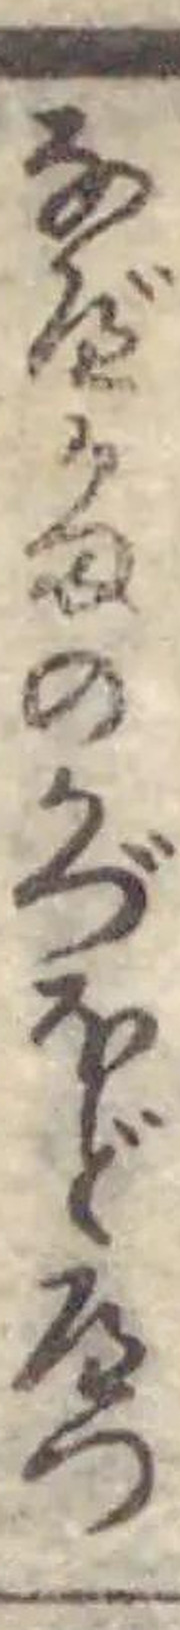なべかまのかづほどへつ
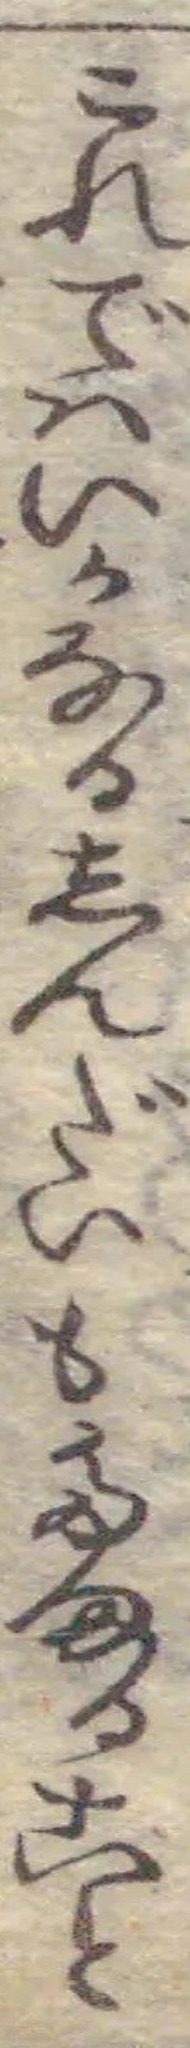これではいかなるしんだいもたまること
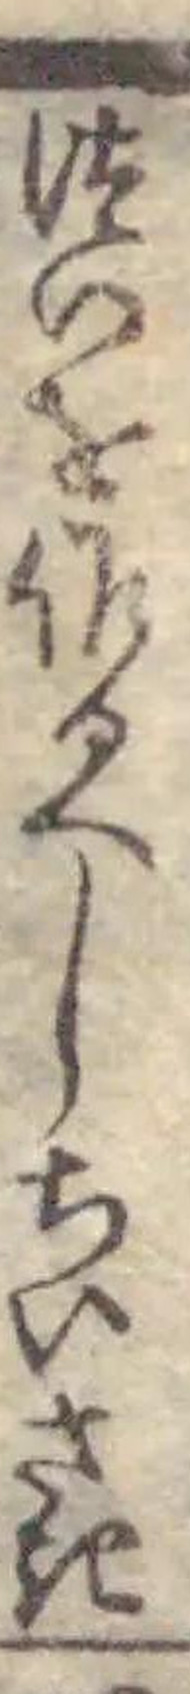ついを作るへしちいさき
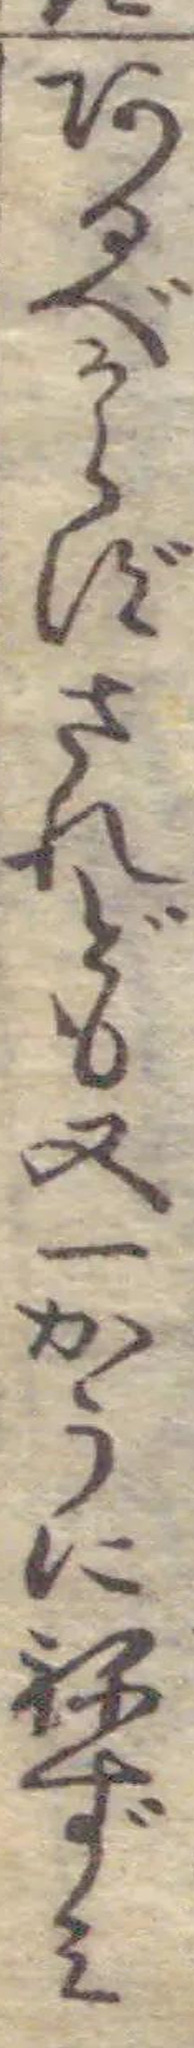あるべからずされども又一かうにねずみ

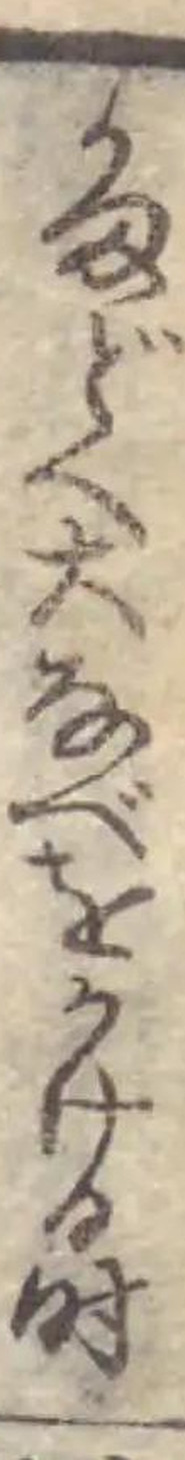かまどへ大なべをかける時
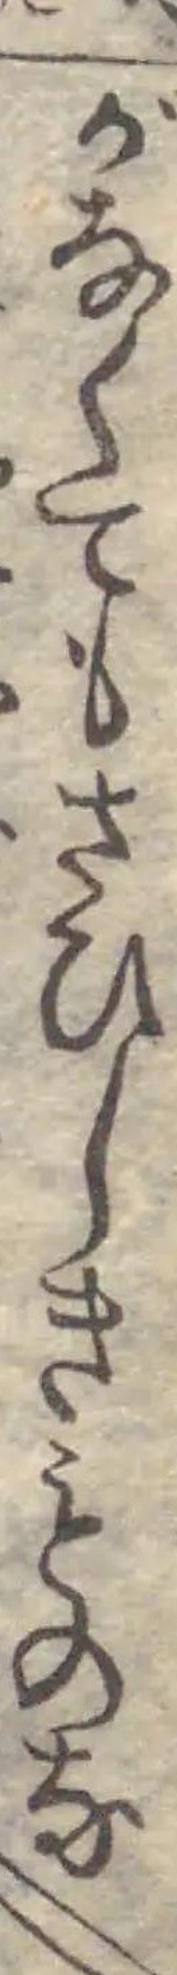がなくてもさひしきものな
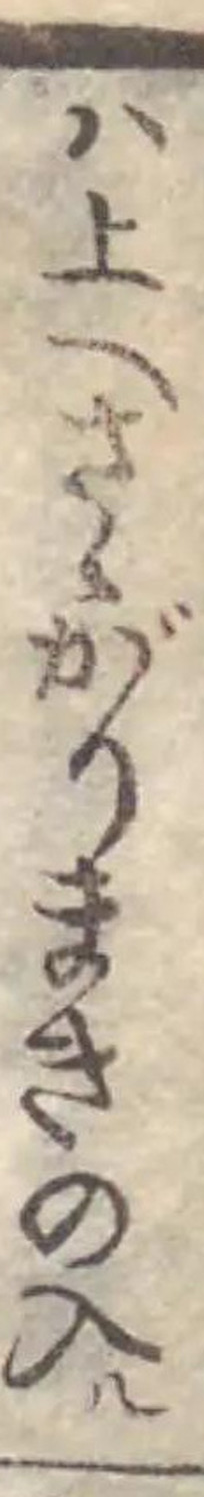は上へさゝがりまきの入
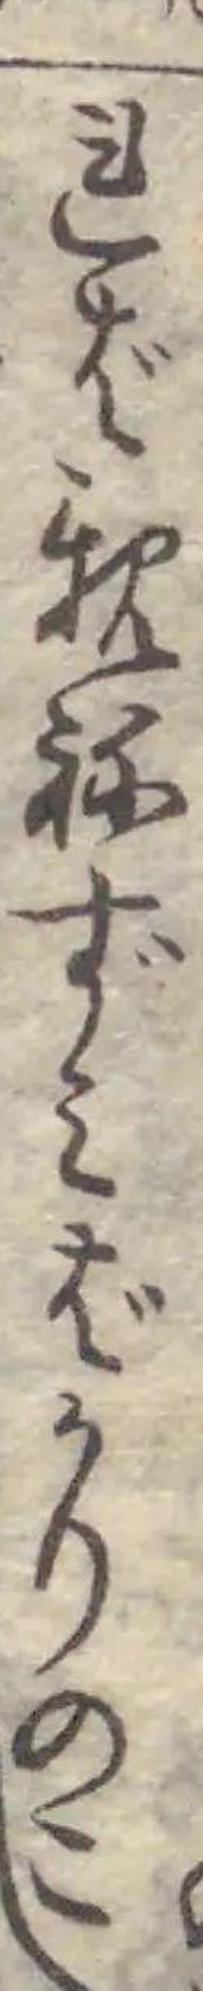れば親ねずみばかりのこし
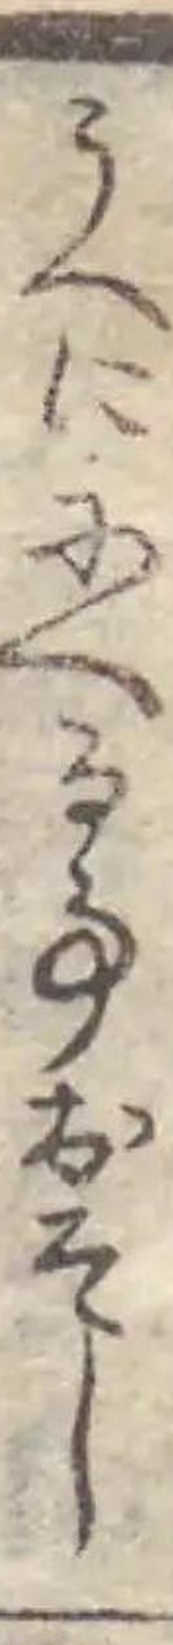うへににへる事おそし
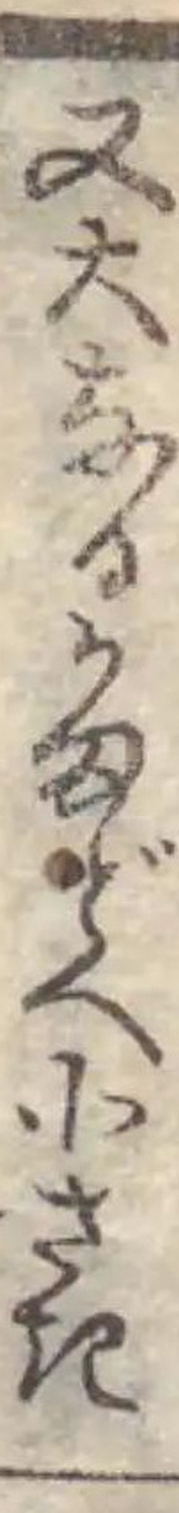又大なるかまどへ小さき
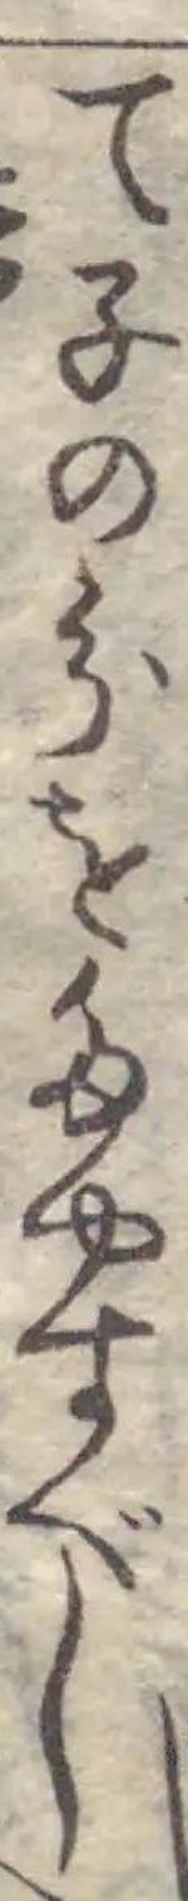て子の分をたやすべし
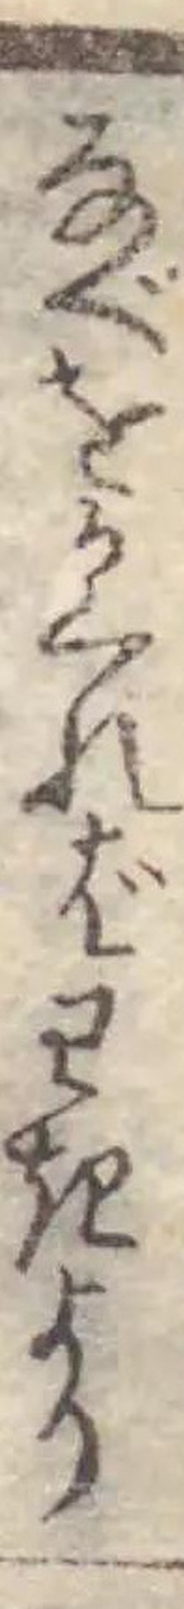なべをかくればわきより
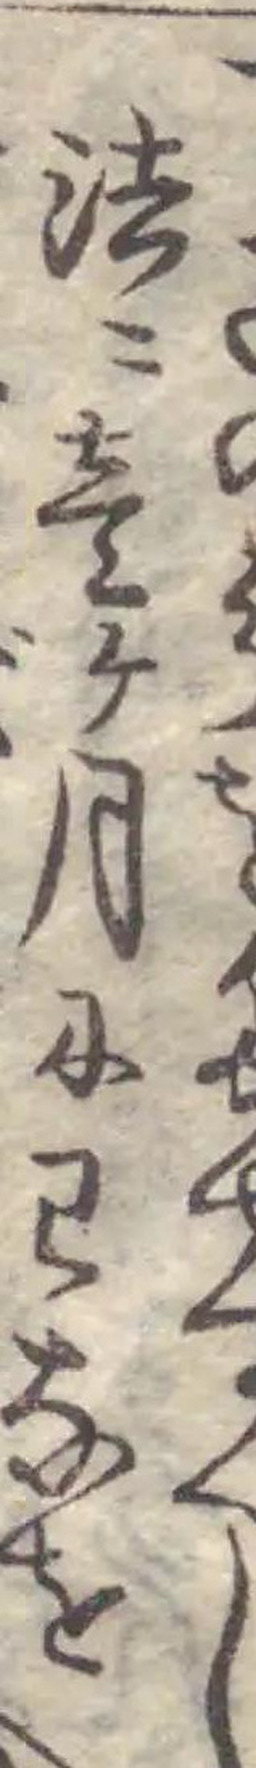法に壱ヶ月にわなを
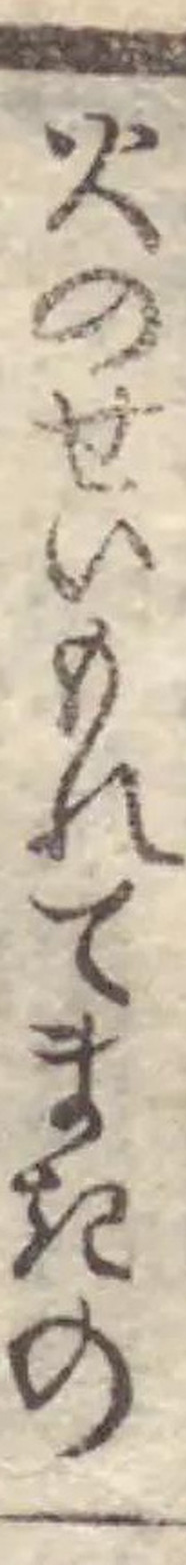火のせいもれてまきの
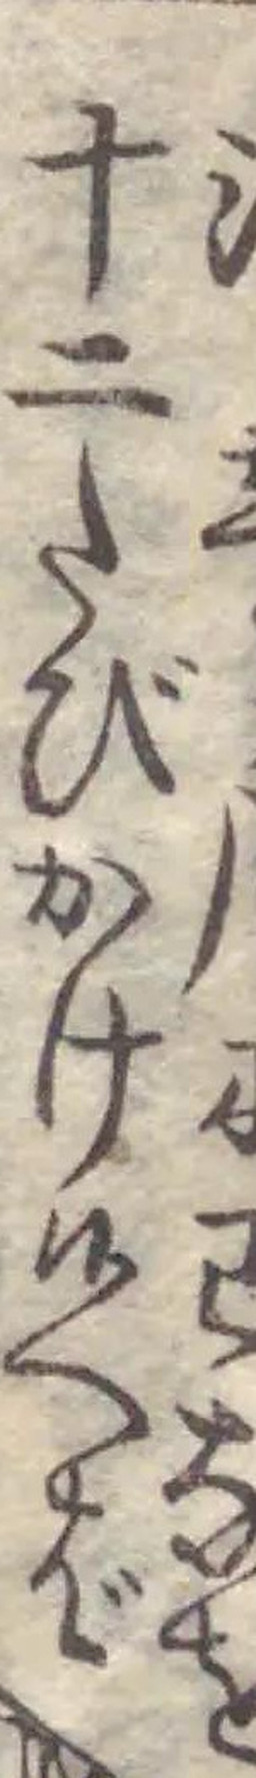十二たびかけ候へば
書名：大通人好記
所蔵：国立国会図書館 National Diet Library, JAPAN
